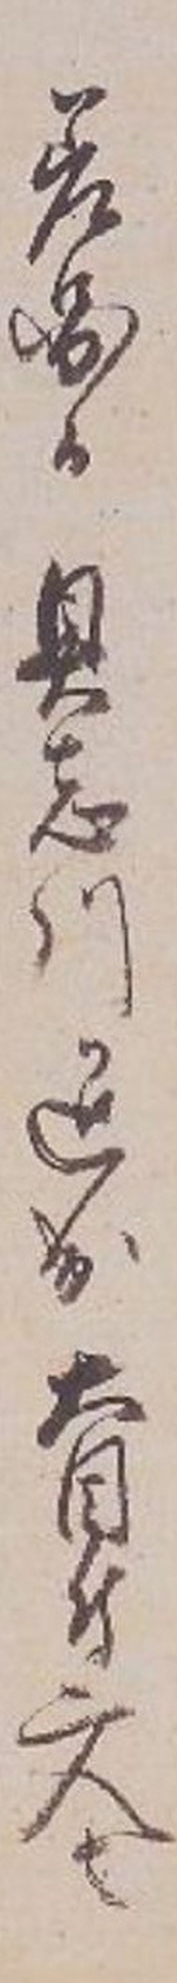差図而具志川退出大目付二人は
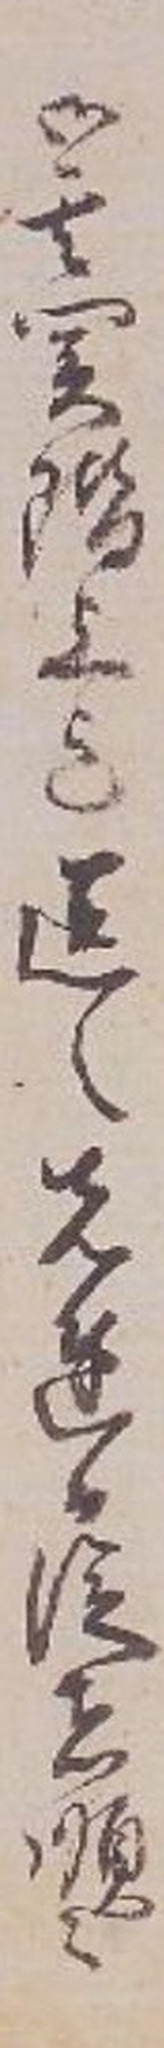御玄関階上迄送之先達而従者順々

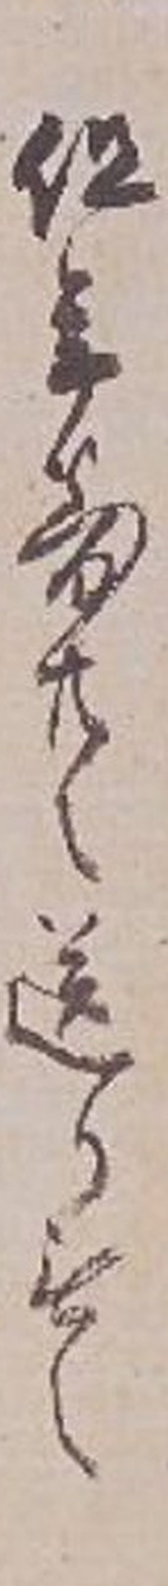但年寄共之送り無之
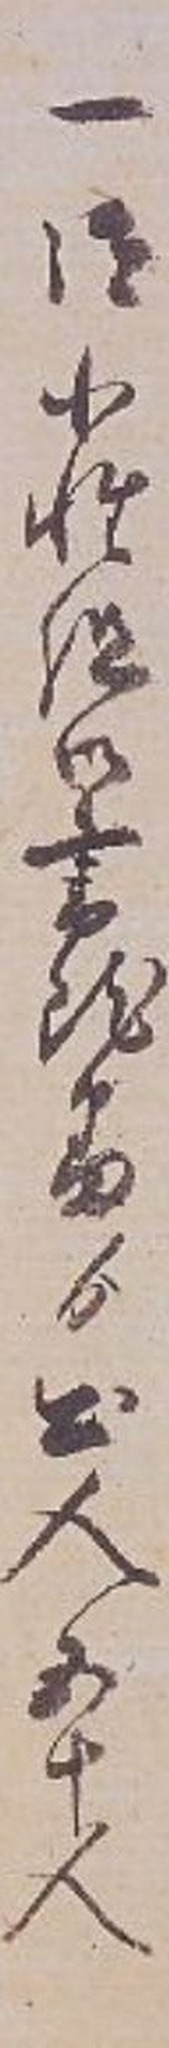一御小性組御書院番ゟ出人五十人
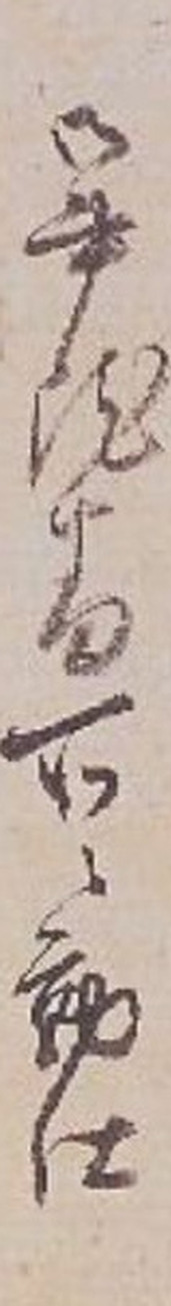御書院番所々勤仕
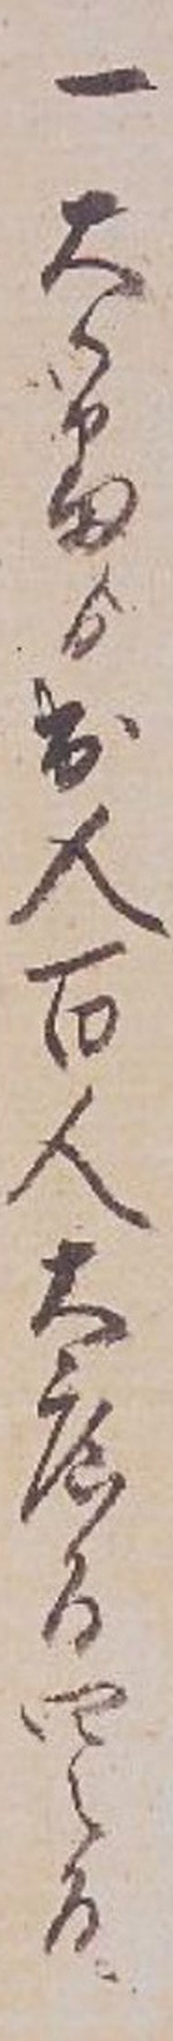一大御番ゟ出人百人大広間四之間
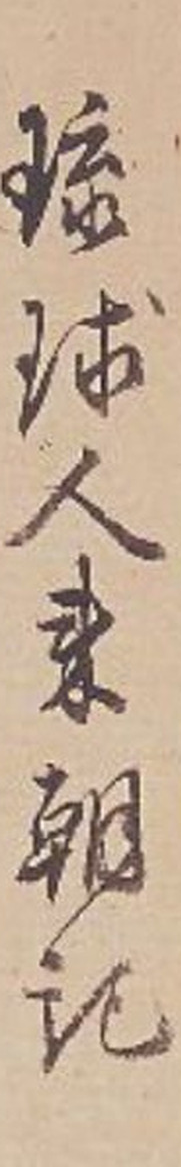琉球人来朝記
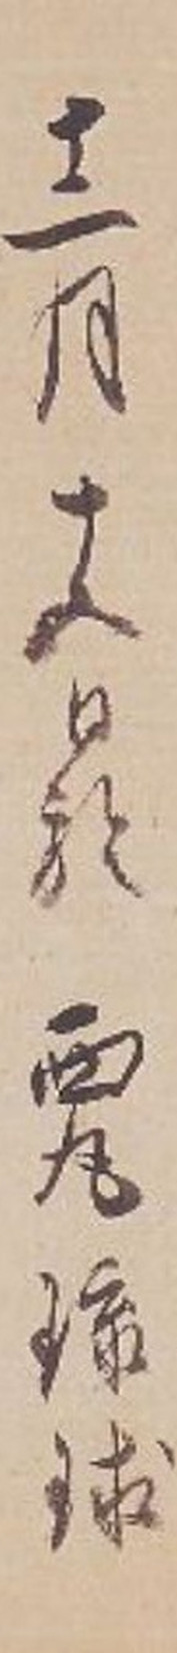十二月十五日於西丸琉球
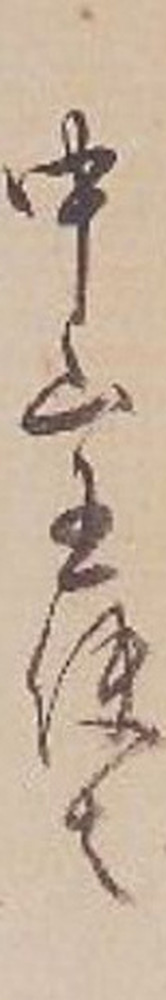中山王使者
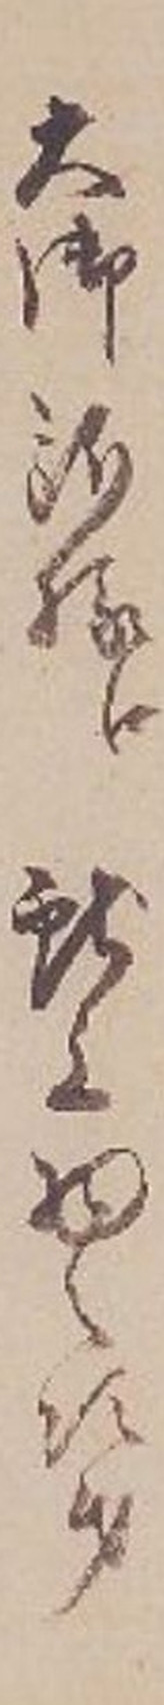大御所様え献上物之次第
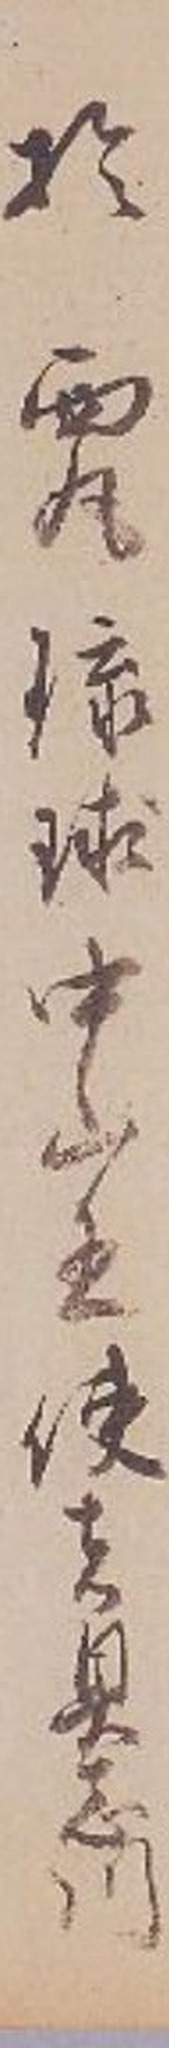於西丸琉球中山王使者具志川
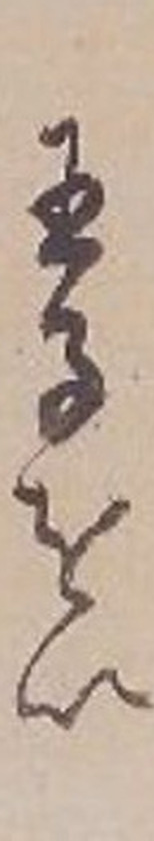王子を以

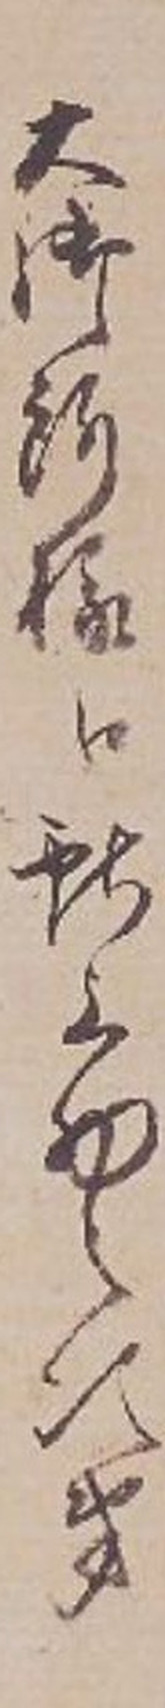大御所様え献上物之次第
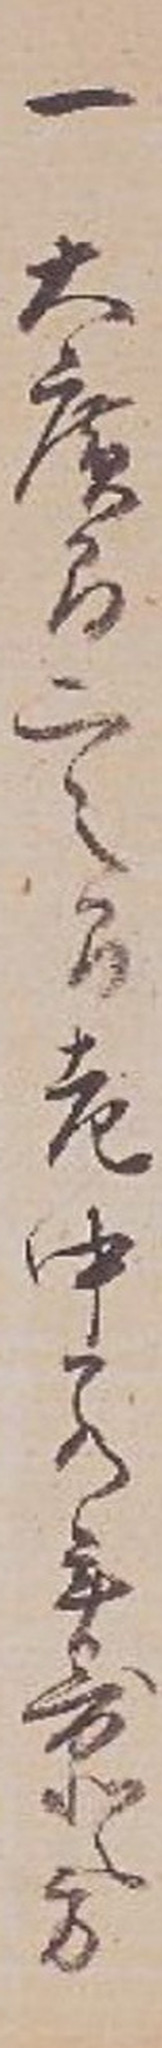一大広間二之間老中若年寄北之方
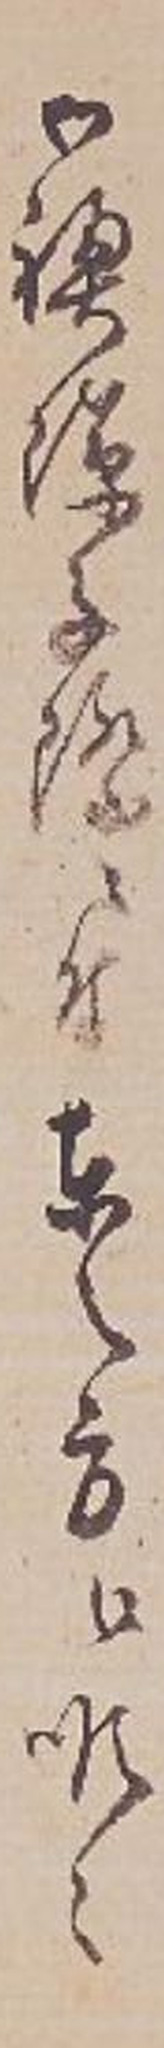御襖障子際に付東之方え順々
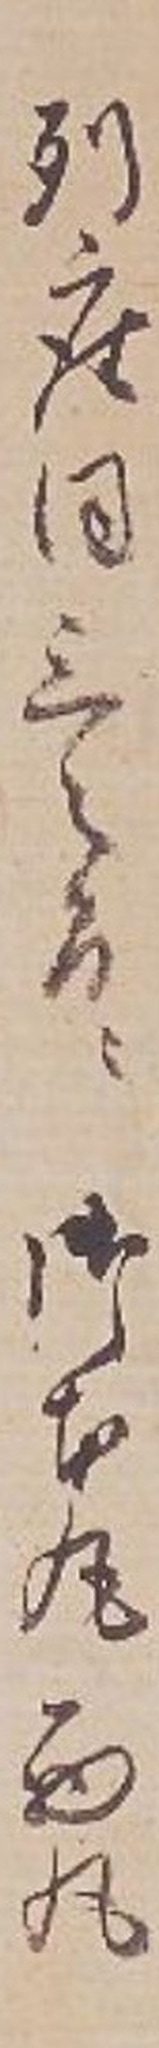列座同三之間に御本丸西丸
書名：琉球人来朝記 五、六、七
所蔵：University of the Ryukyus Library
